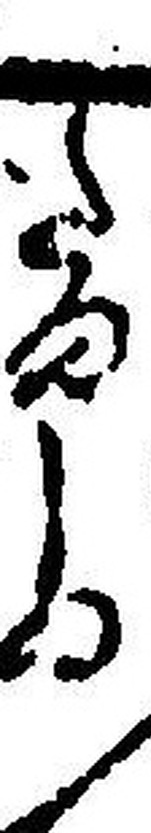たましゐ
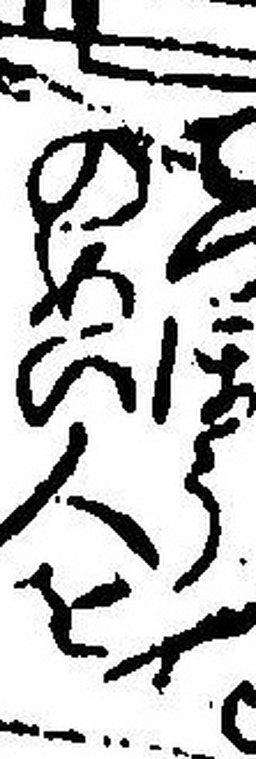のめい人を
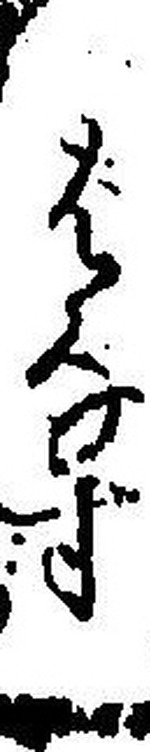はなす
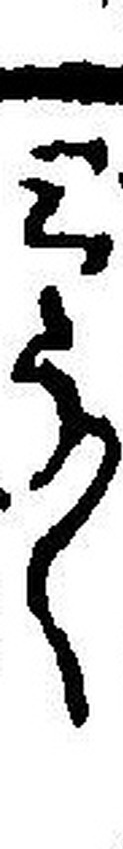どう〳〵
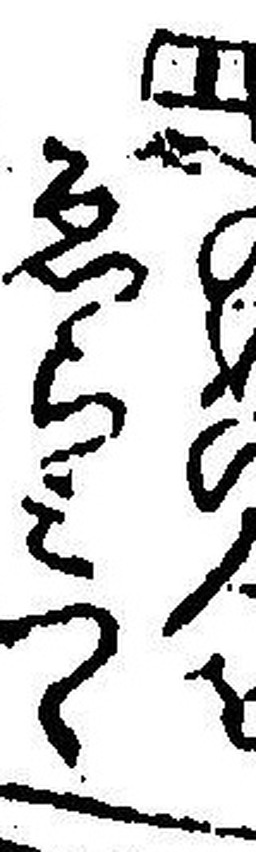えらみつゝ
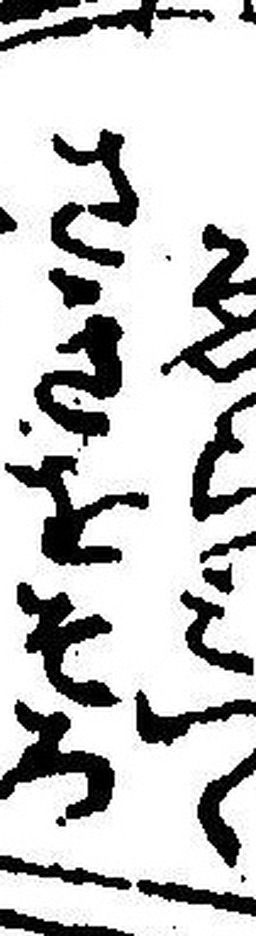さきをそろ
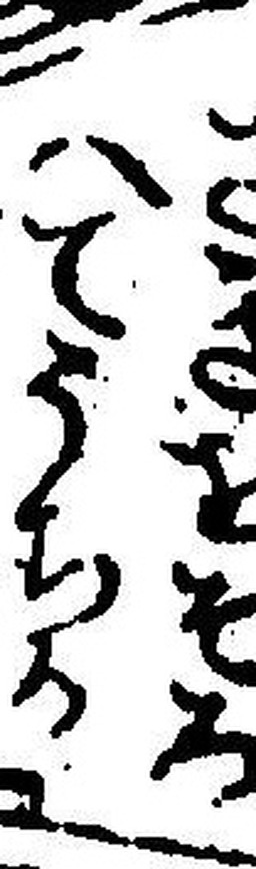へてうちか
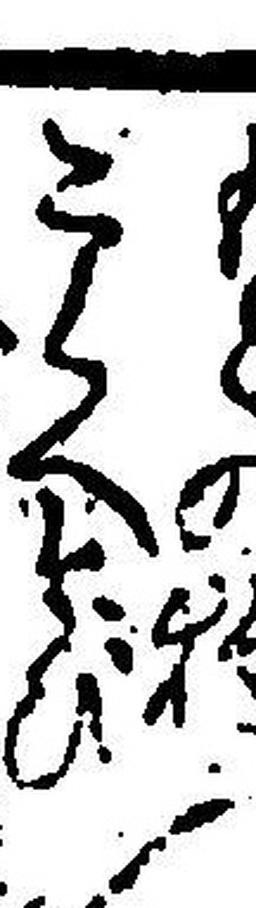こくへとび
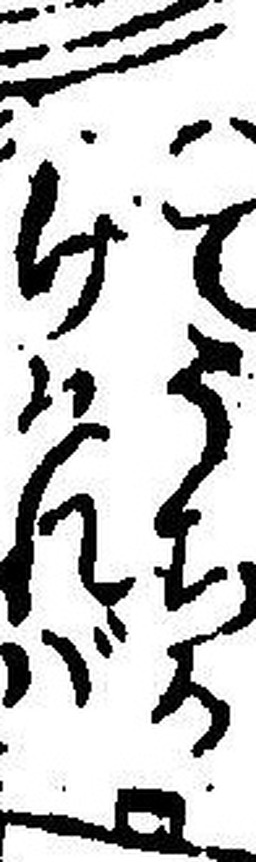ければ
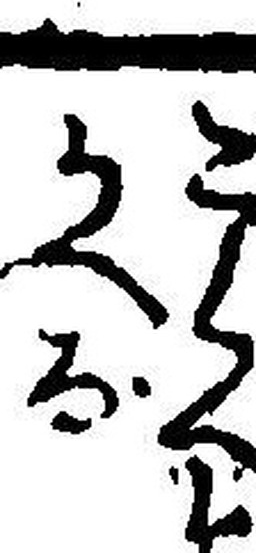かへる
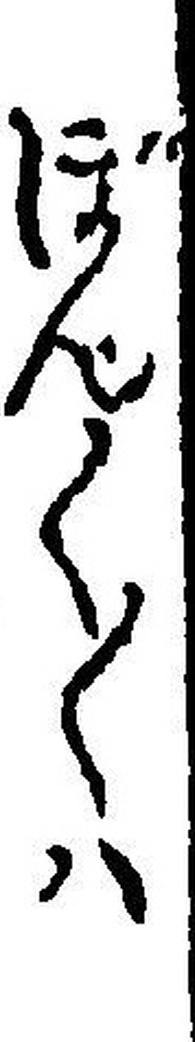ぼん〳〵〳〵は
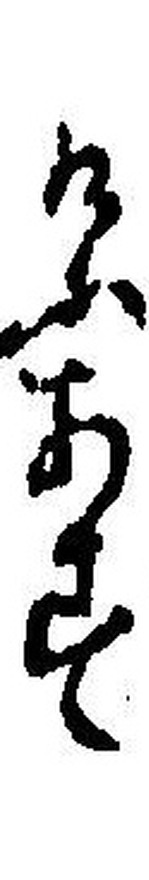けふあす
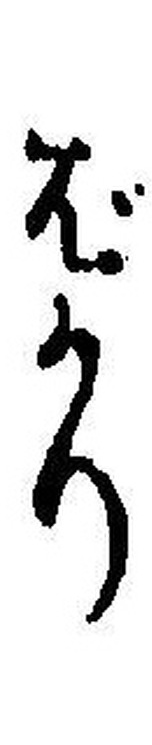ばかり
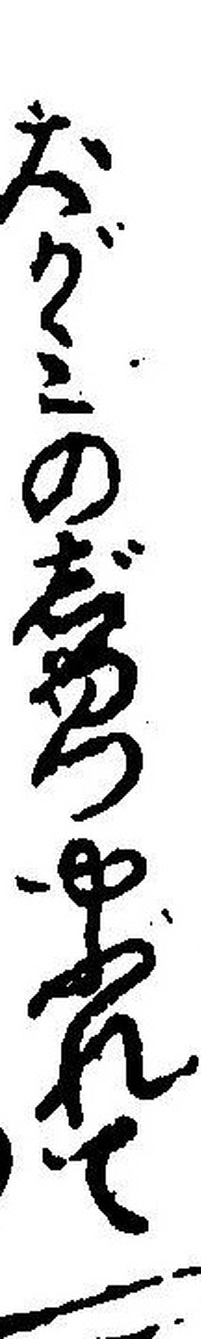犬がみのじゆつやふれて
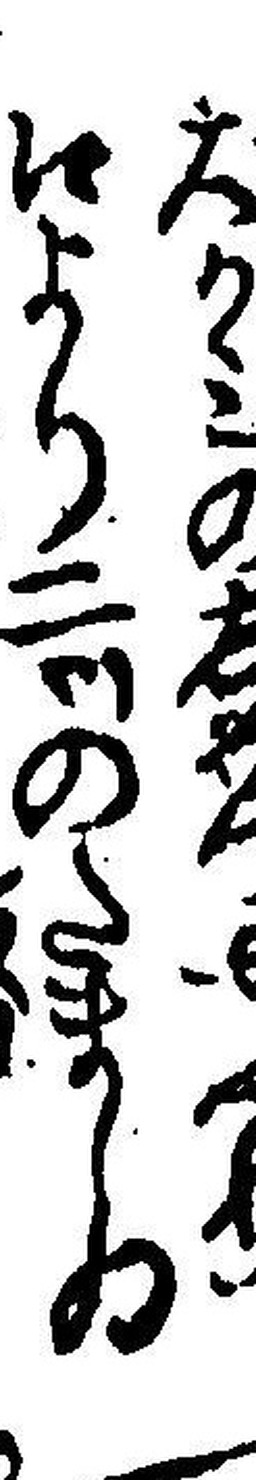口より二つのたましゐ
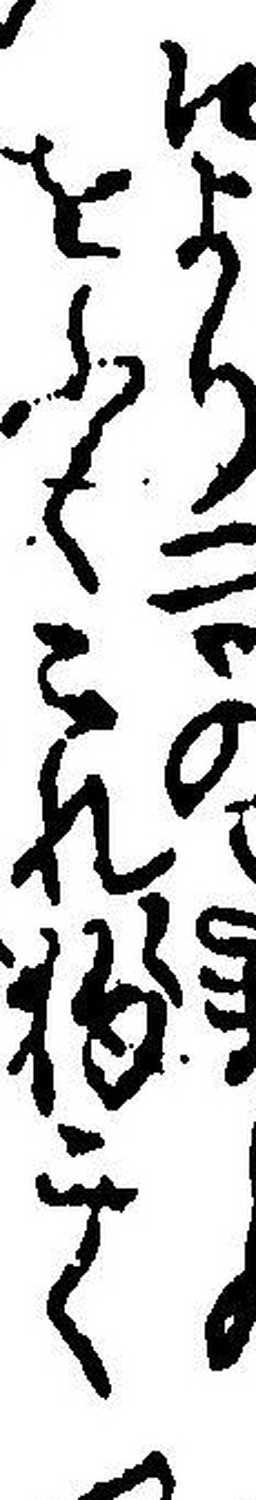をふくこれ狗こく
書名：花芳野犬斑 / 山東京伝作
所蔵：東京大学総合図書館 General Library in the University of Tokyo, JAPAN
